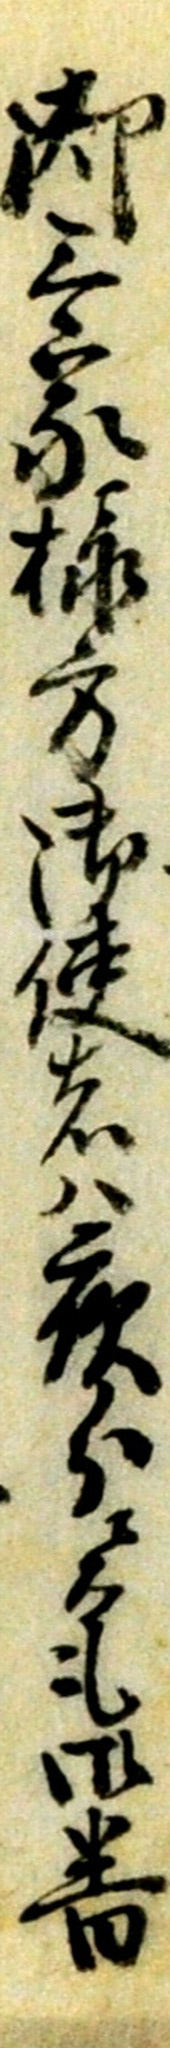御三家様方御使者ハ夜分ニ而も御番
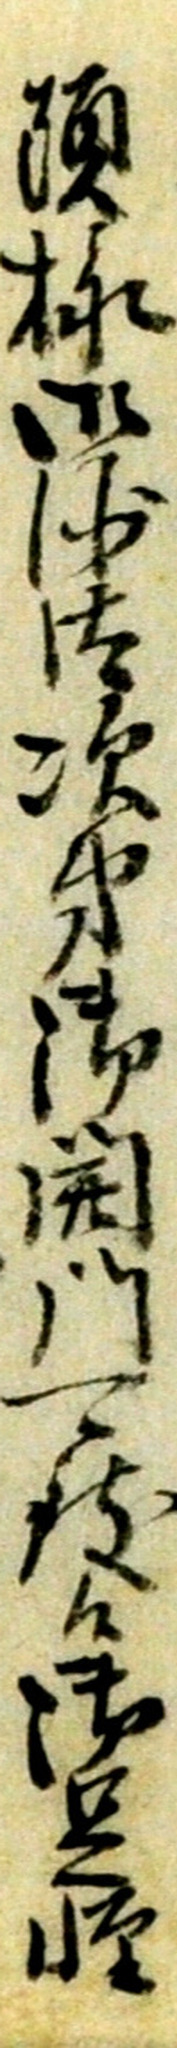頭様御沙汰次第御開門可致候御足軽
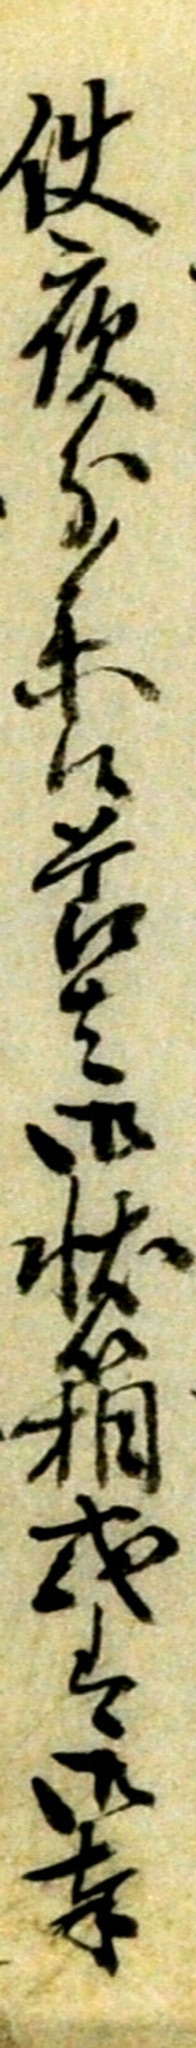使夜分参候節者御状箱或は御奉
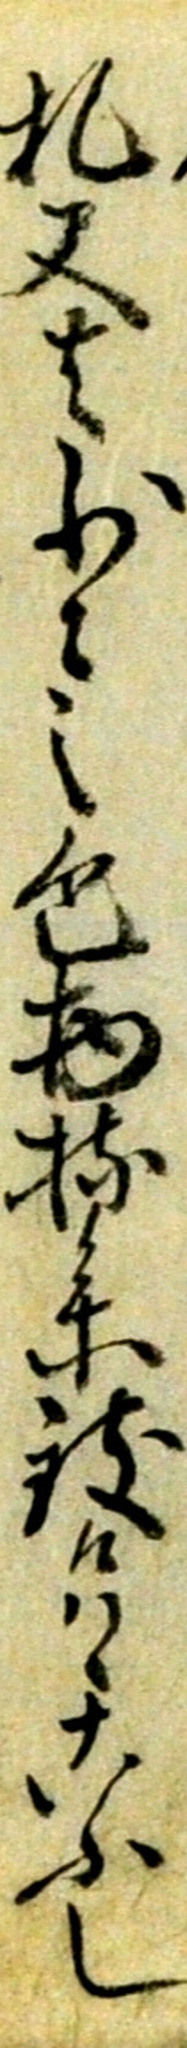札又者少々之色物持参致候ハヽこふし
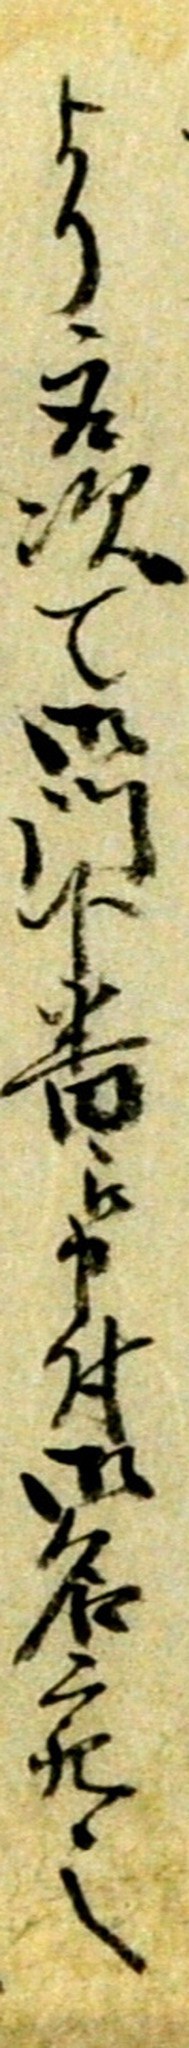より取次て御門下版江申付御名宛之
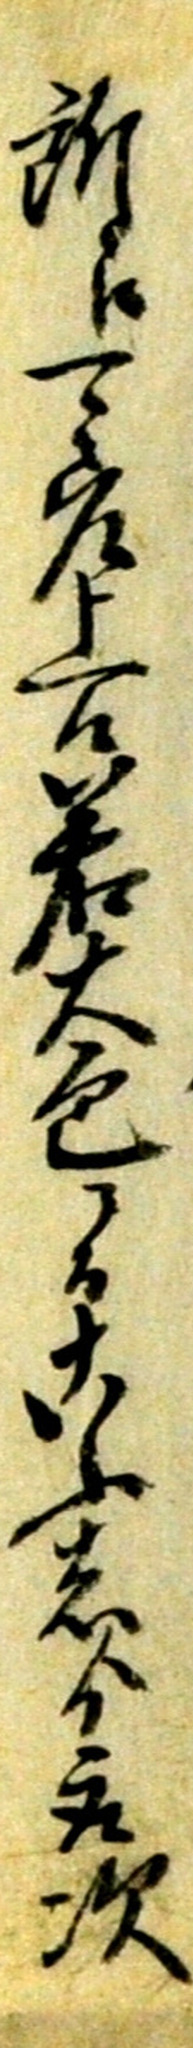所江可差上候若大色ニ而こふしゟ取次

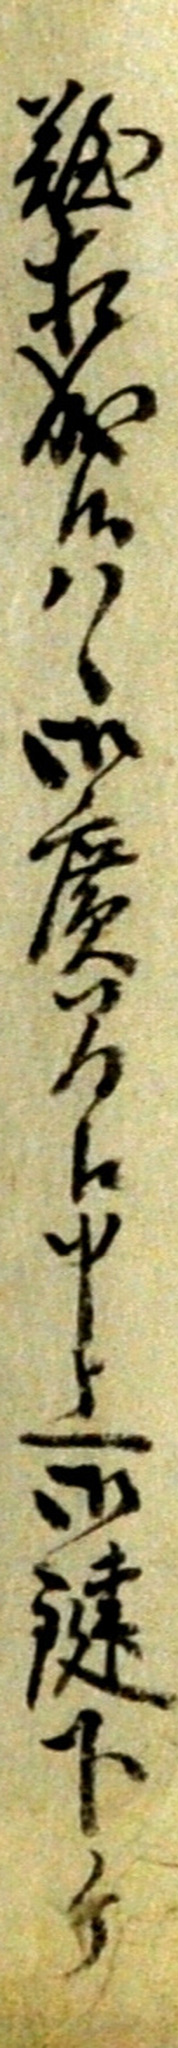難相成候ハヽ御広間江申上御鍵下ケ
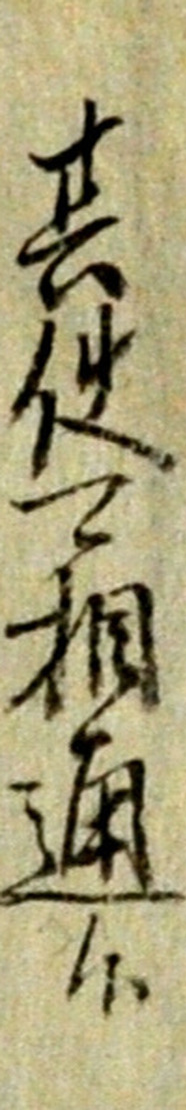其使可相通候
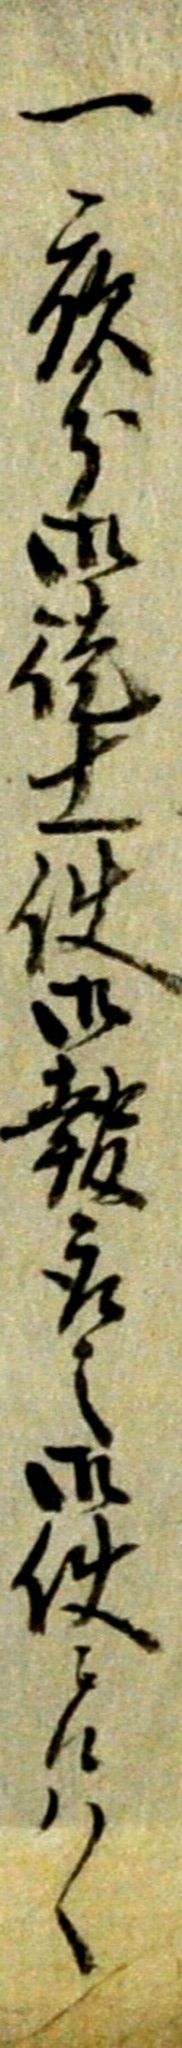一夜分御徒士使御報取之御使ニ候ハヽ
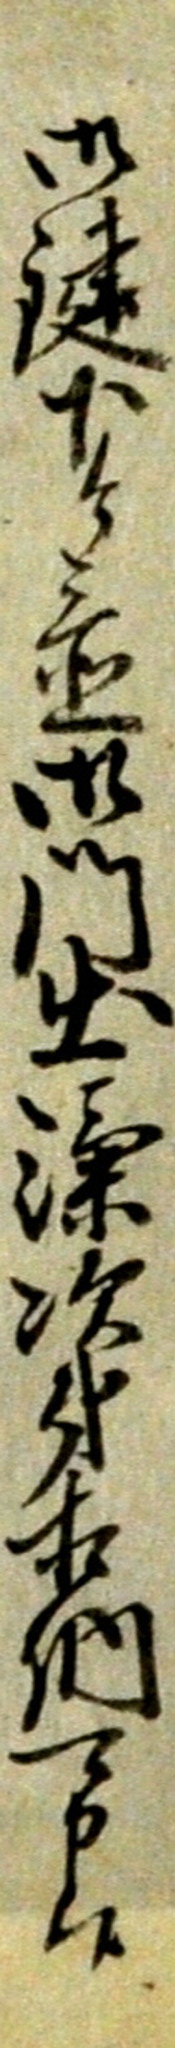御鍵下ケ置御門出済次第相納可申候
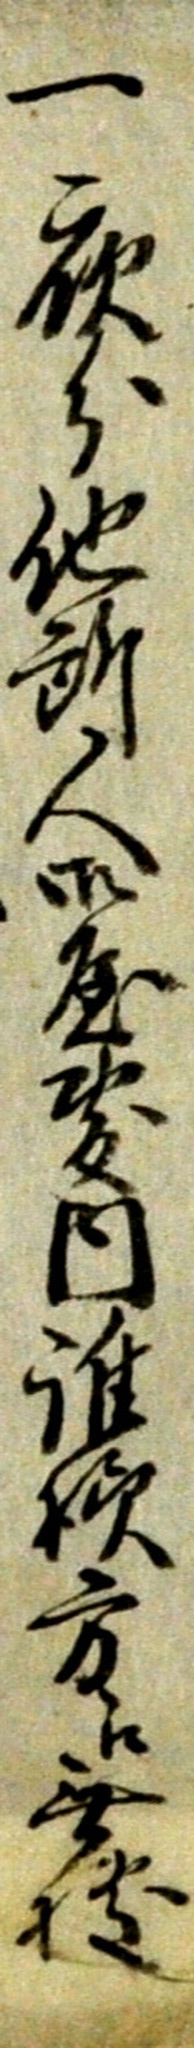一夜分他所人御屋敷内誰様方江無拠
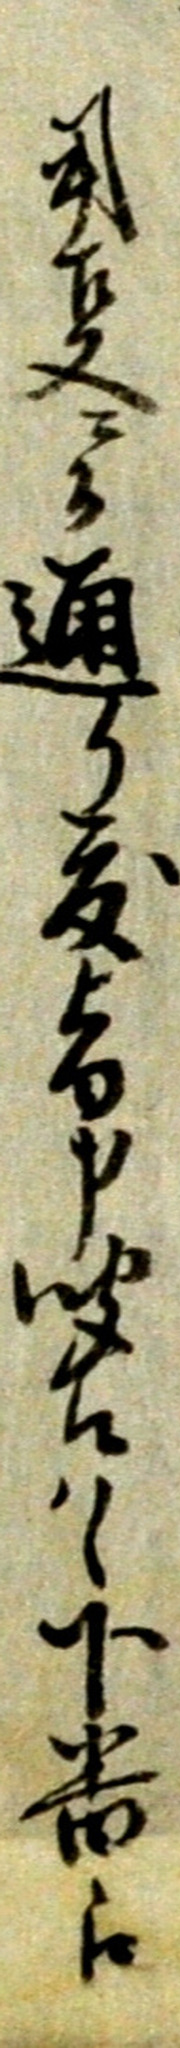用事ニ而通り度旨申聞候ハヽ下番江
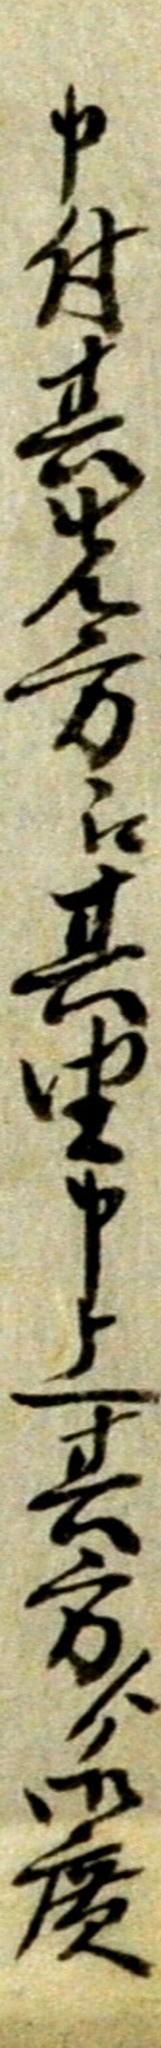申付其先方江其由申上其方ゟ御広
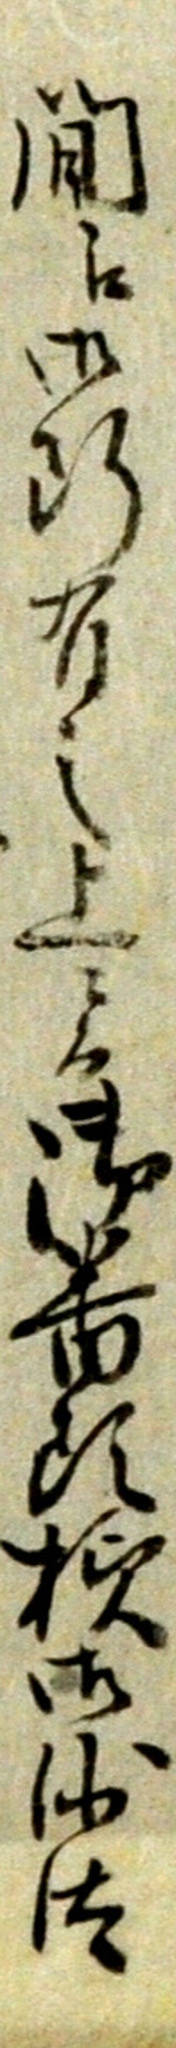間江御断有之上ニ而御番頭様御沙汰
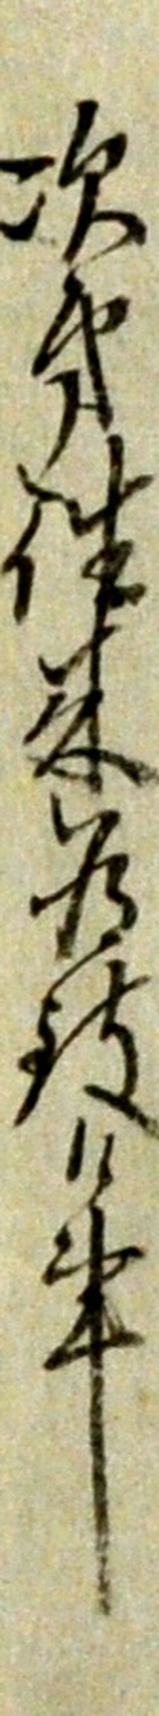次第往来為致候事
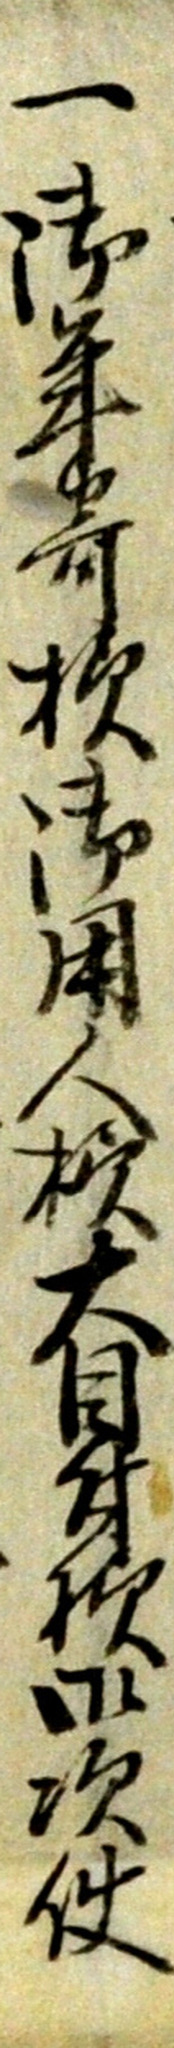一御年寄様御用人様大目付様御次使
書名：御先手組江戸御屋敷御門番勤方
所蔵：伊那市立高遠町図書館・合同会社AMANE
